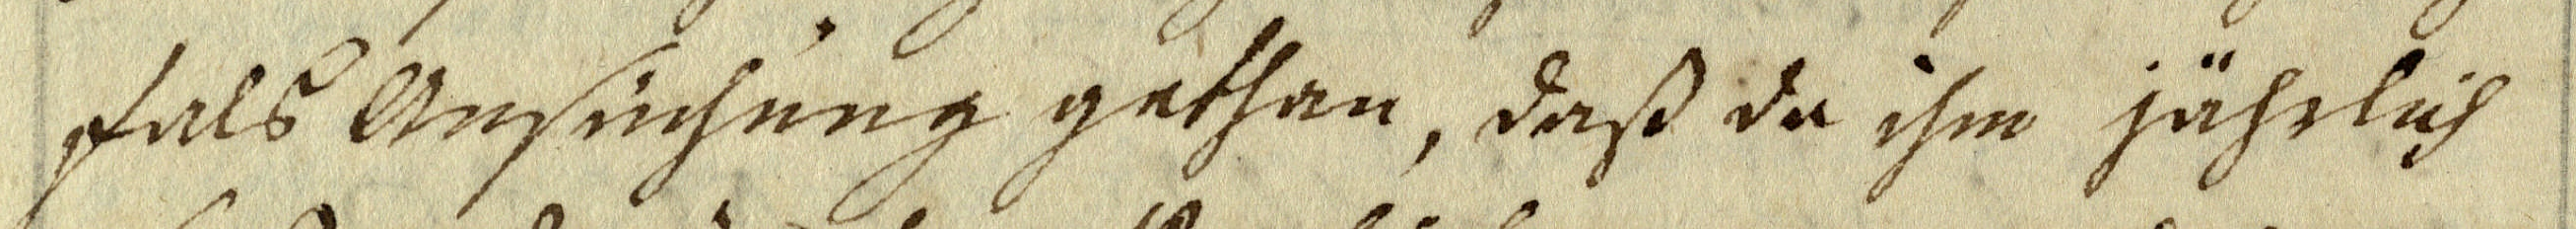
fals Ansuchung gethan, daß da ihm jährlich
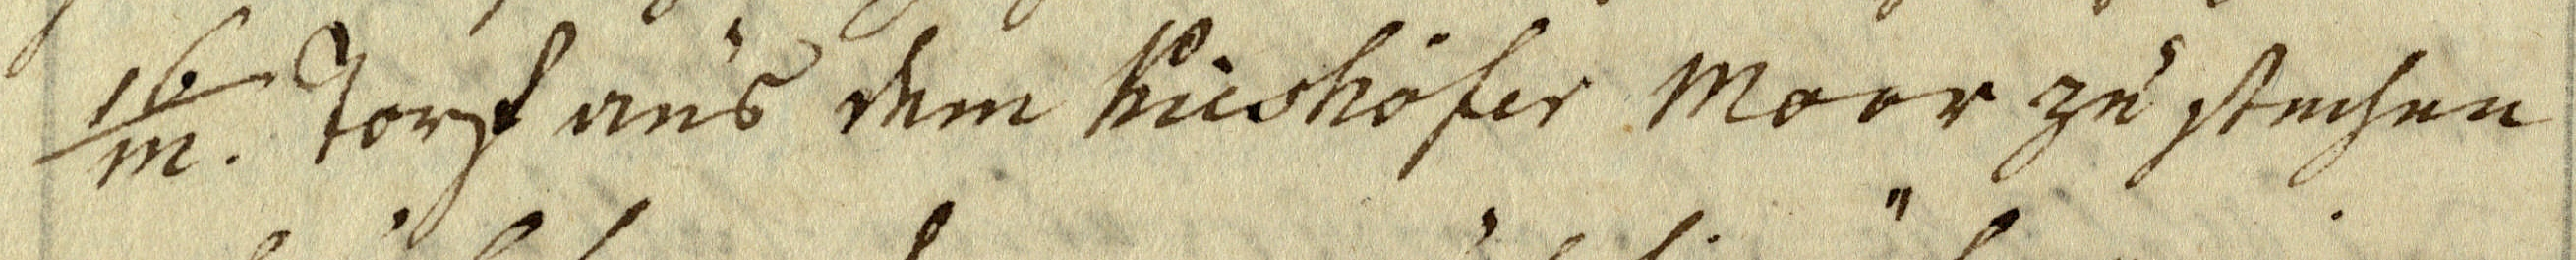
16/m Torf aus dem Kieshöfer Moor zu stechen
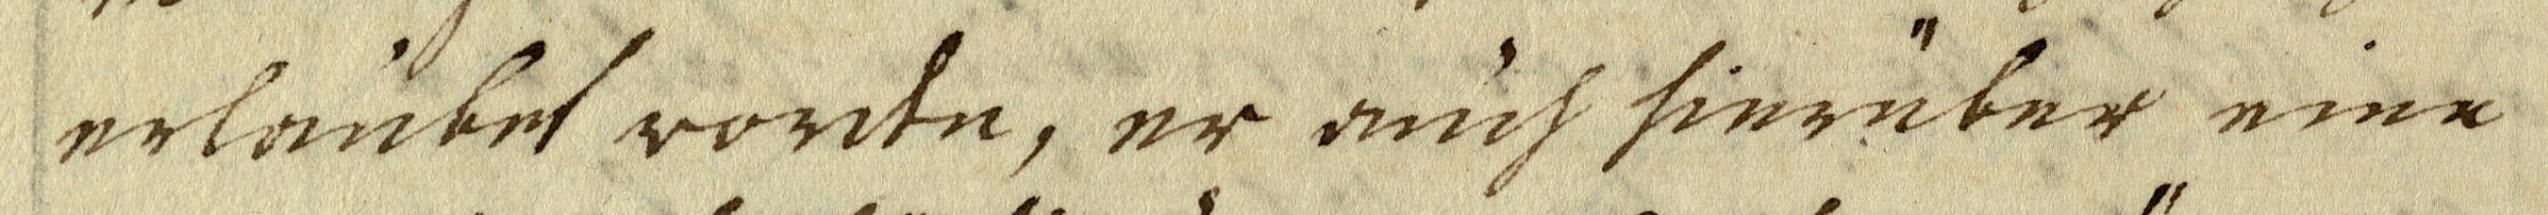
erlaubt worden, er auch hierüber eine
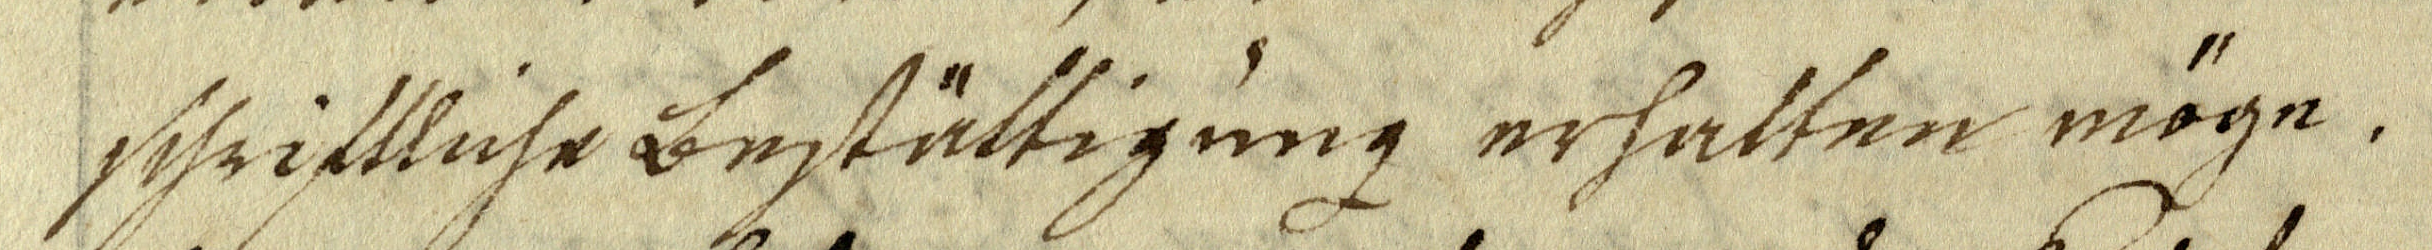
schriftliche Bestättigung erhalten möge.
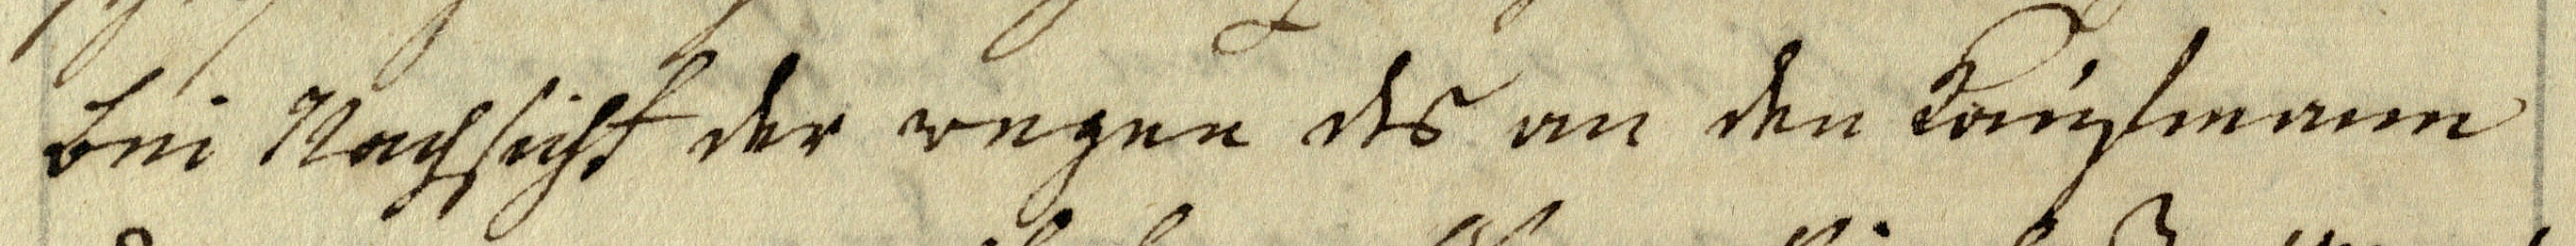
Bei Nachsicht der wegen des an den Kaufmann
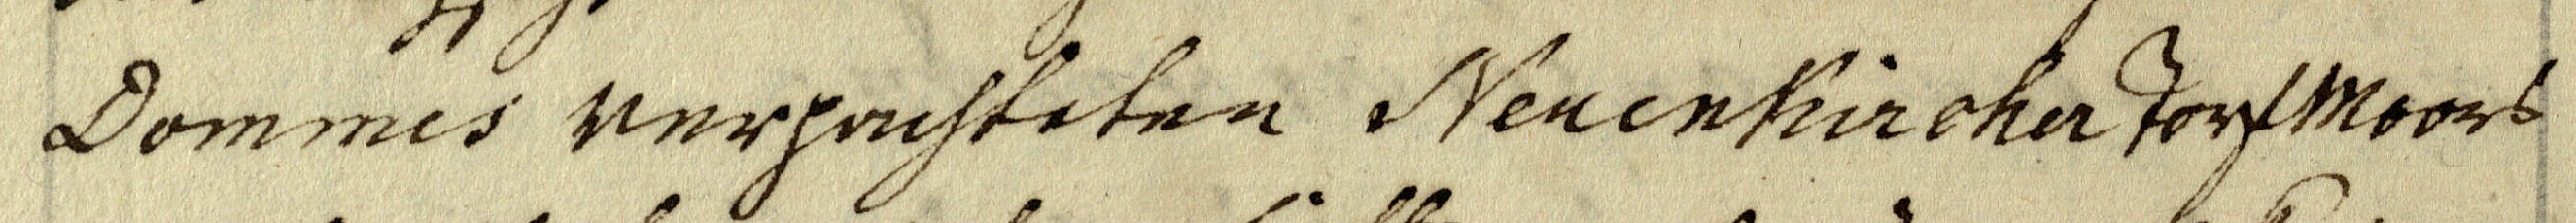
Dommes verpachteten Neuenkircher Torfmoors
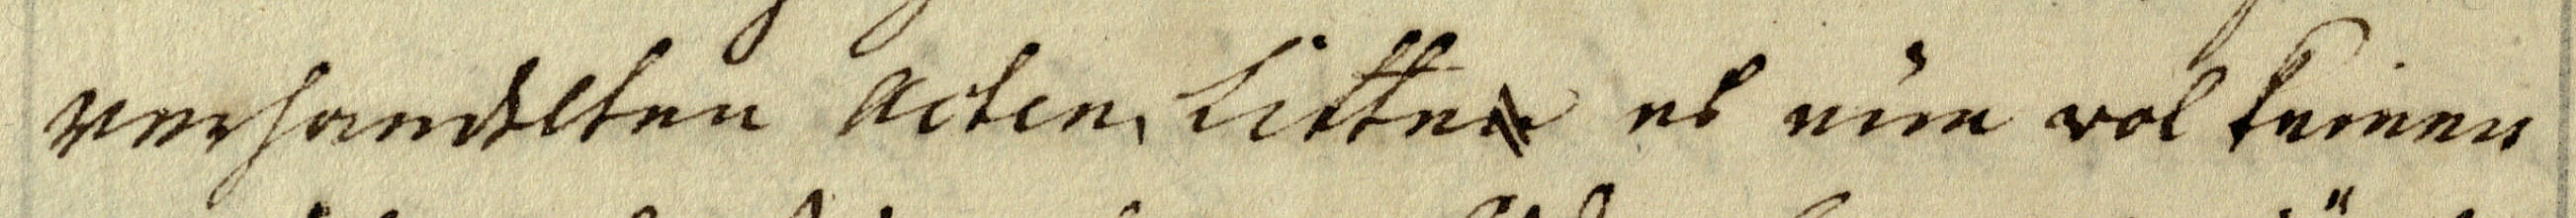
verhandelten Acten, litte es nun wol keinen
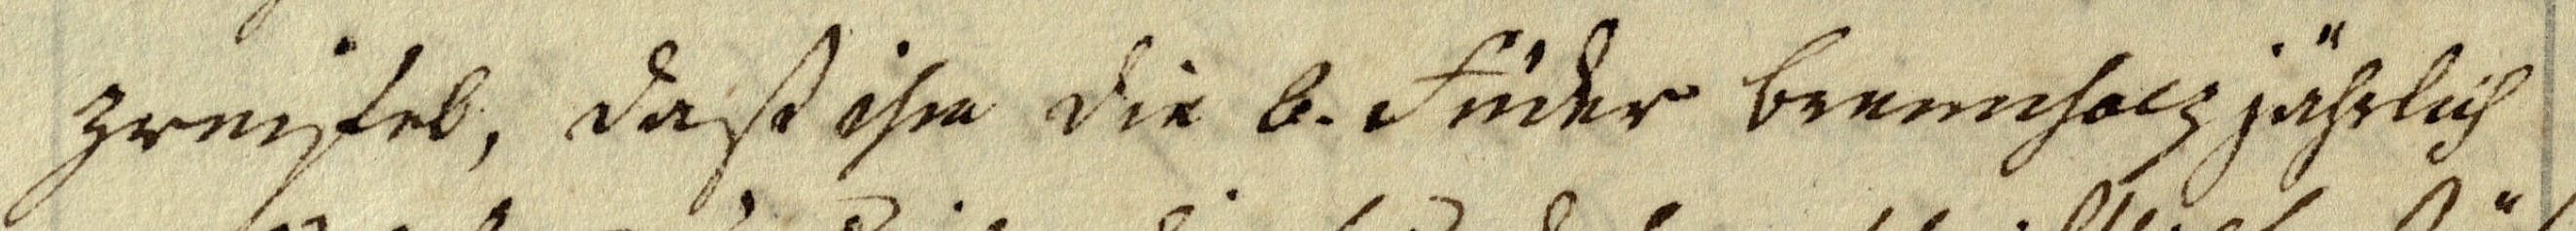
Zweifel, daß ihm die 8. Fuder Brennholz jährlich
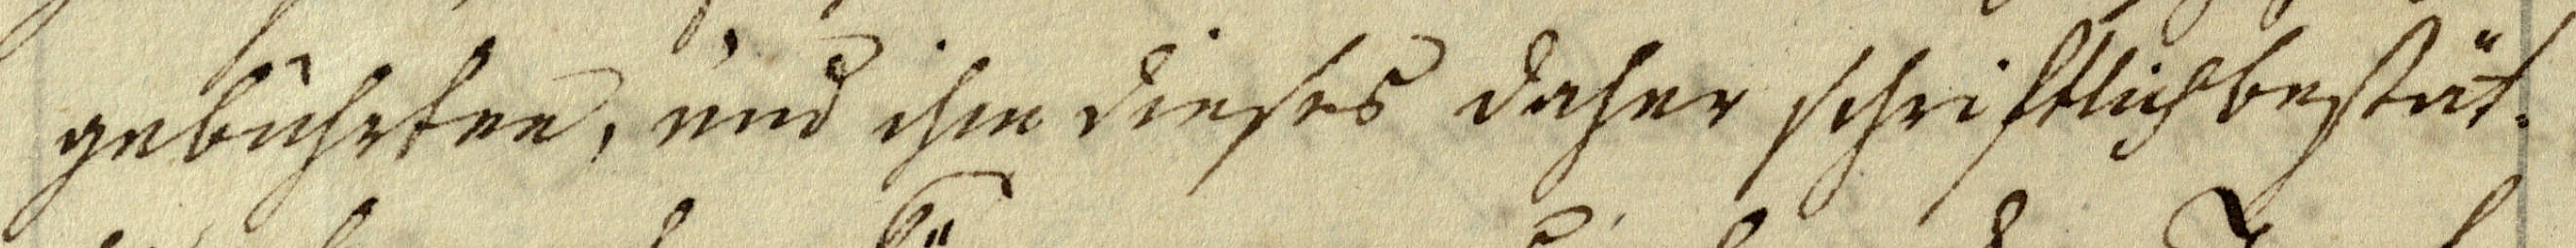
gebührten, und ihm dieses daher schriftlich bestät¬
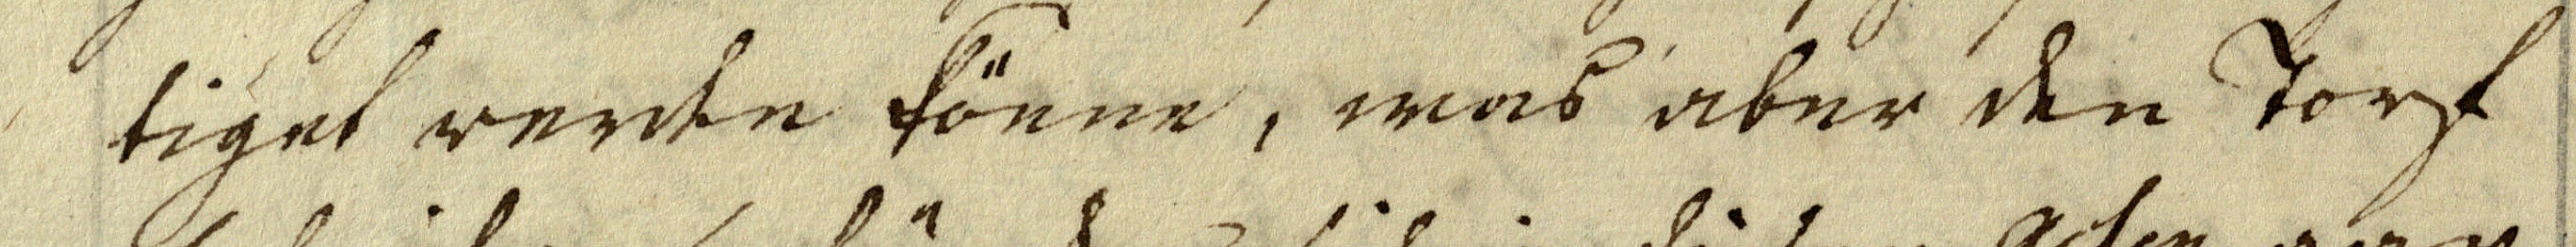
tiget werden könne, was aber den Torf
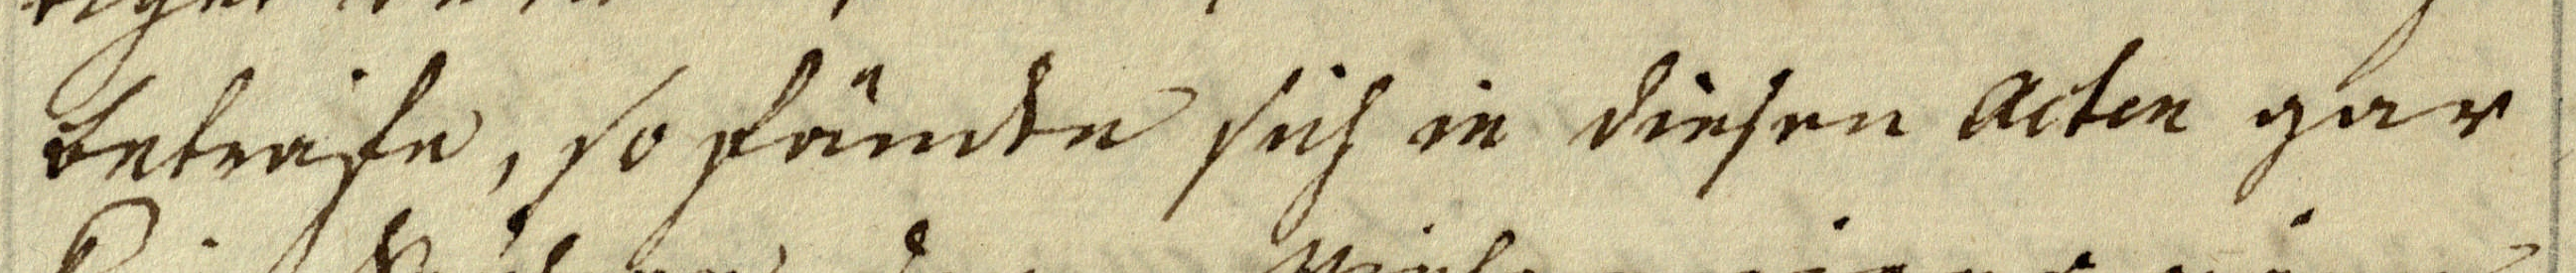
beträfe, so fände sich in diesen Acten gar
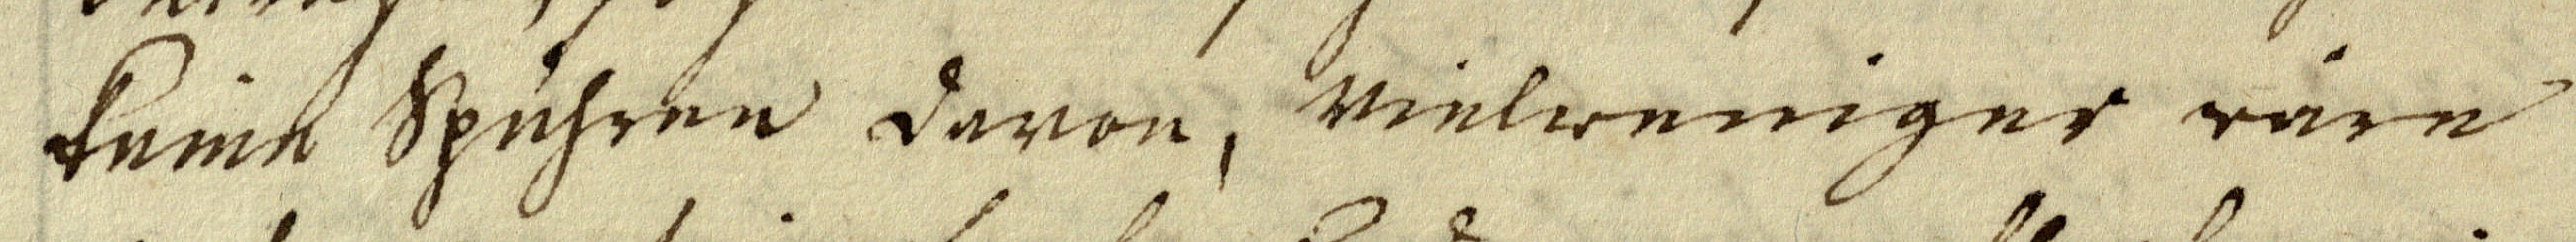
keine Spuren davon, vielweniger wäre
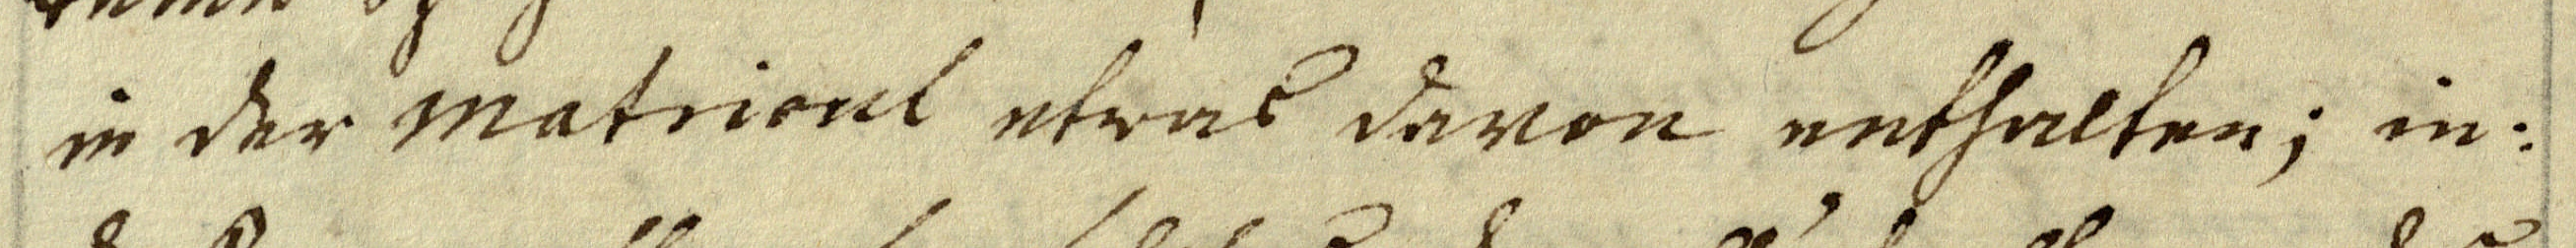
in der Matricul etwas davon enthalten; in¬
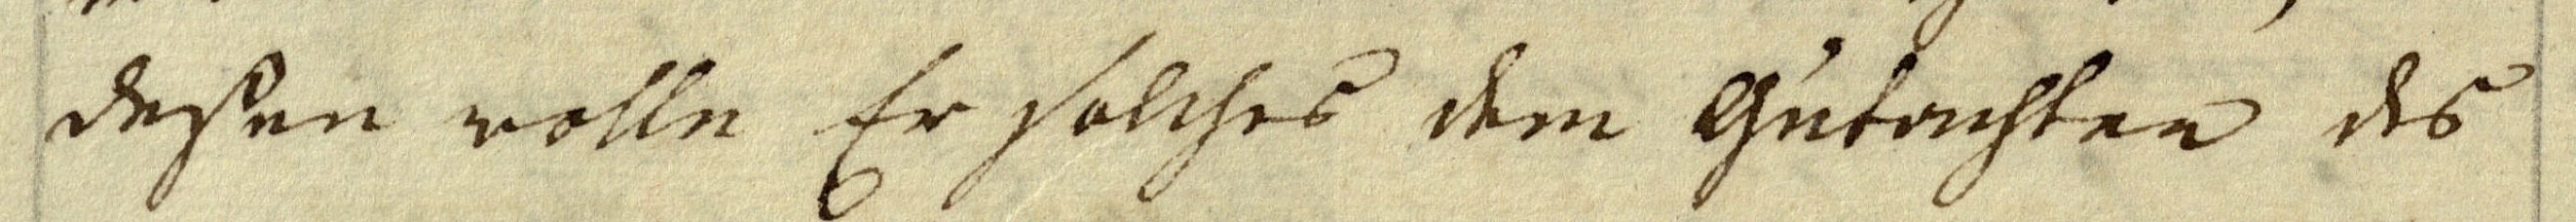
deßen wolle Er solches dem Gutachten des
